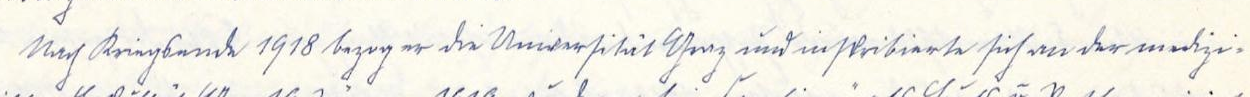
Nach Kriegsende 1918 bezog er die Universität Graz und inskribierte sich an der medzi-
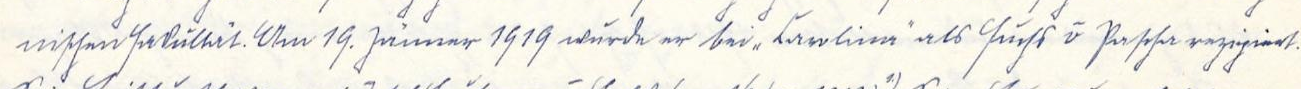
nischen Fakultät. Am 19. Jänner 1919 wurde er bei "Carolina“ als Fuchs v/o Pascha rezipiert.
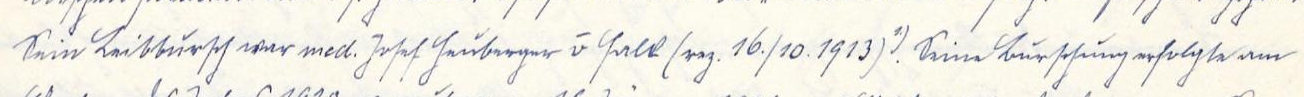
Sein Leibbursch war als. Josef Heuberger v/o Falk (rez 16./10. 1913) 1). Seine Burschung erfolgte am
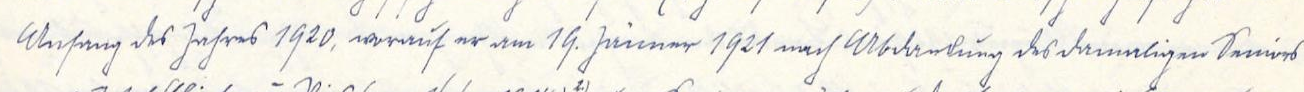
Anfang des Jahres 1920, worauf er am 19. Jänner 1921 nach Abdankung des damaligen Seniors
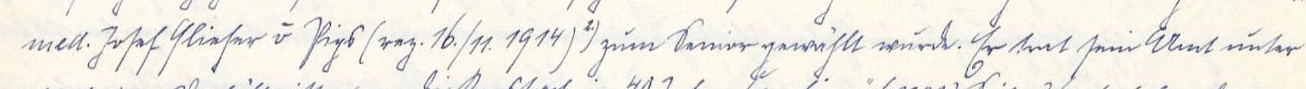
med. Josef Flieher v/o Pips (rez. 16/1. 1914) 2) zum Senior gewählt wurde. Er trat sein Amt unter
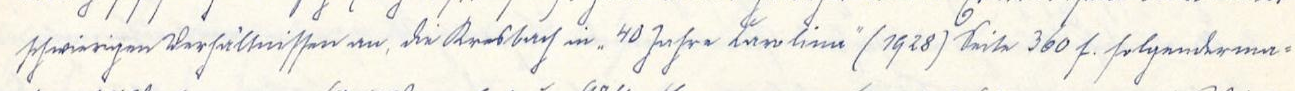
schwierigen Verhältnissen an, die Kresbach in "40 Jahre Carolina" (1928) Seite 30 f. folgenderma-
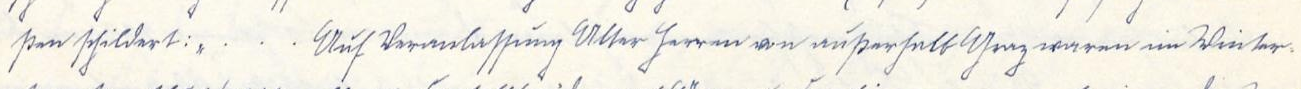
ßen schilderte: Auf Veranlassung Alter Herrn von außerhalb Graz waren im Winter-
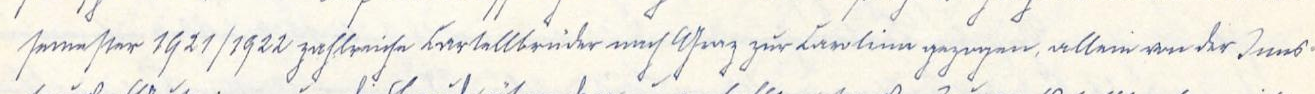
semester 1921 /1922 zahlreiche Cartellbrüder nach Graz zur Carolina gezogen, allein von der Inns-
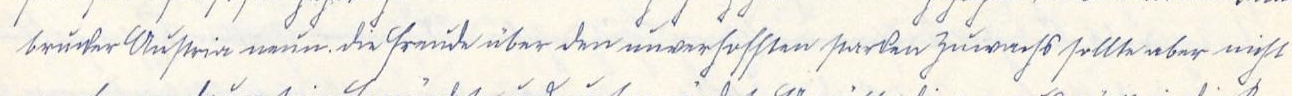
brucker Austria neun. Die Freude über den unverhofften starken Zuwachs sollte aber nicht
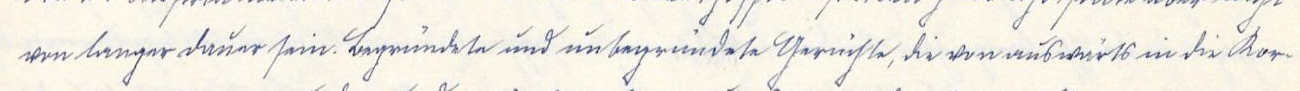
von langer Dauer sein. Begründete und unbegründete Gerüchte, die von auswärts in die Kor-
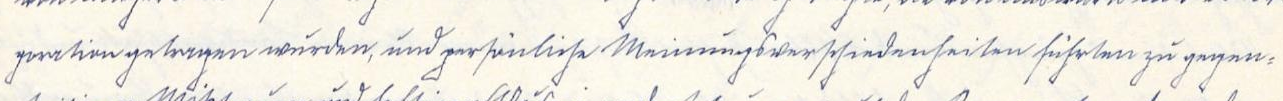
poration getragen wurden, und persönliche Meinungsverschiedenheiten führte zu gegen-
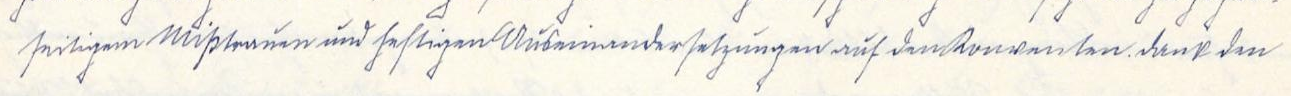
seitigem Mißtrauen und heftigen Auseinandersetzungen auf den Konventen. Dank den
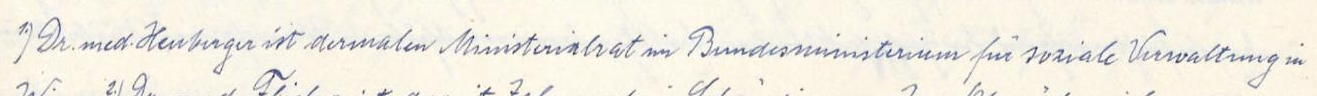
1.) Dr. und. Hauberger ist dermalen Ministerialrat im Bundesministerium für soziale Verwaltung im
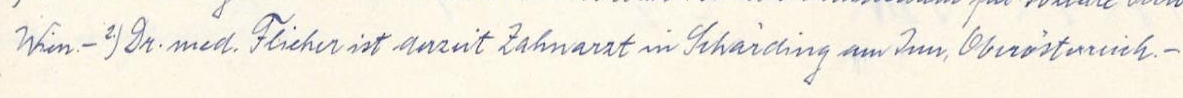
Wien - 2.) Dr. med. Fischer ist derzeit Zahnarzt in Schärding am Inn, Oberösterreich.-
